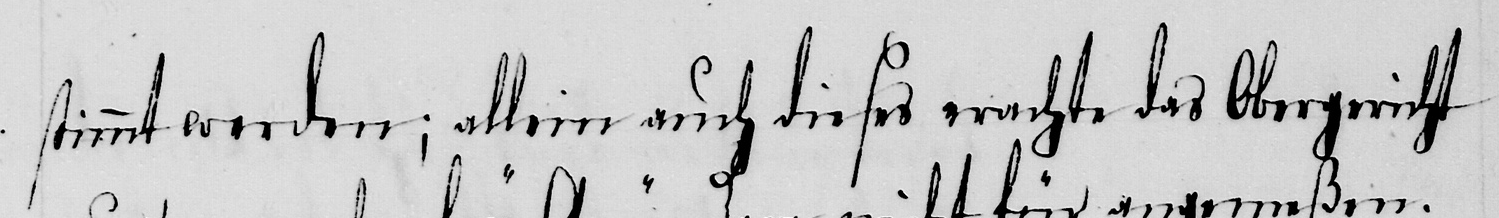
stimmt werden; allein auch dieses erachte das Obergericht
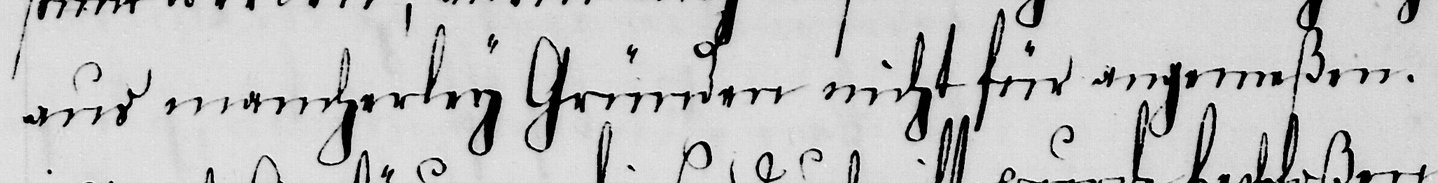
aus mancherley Gründen nicht für angemeßen.
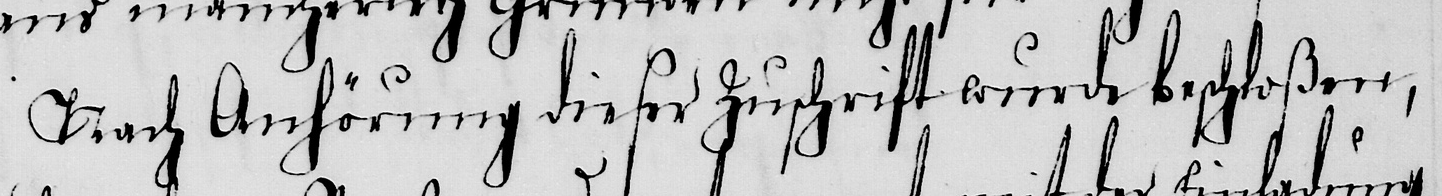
Nach Anhörung dieser Zuschrift wurde beschloßen,
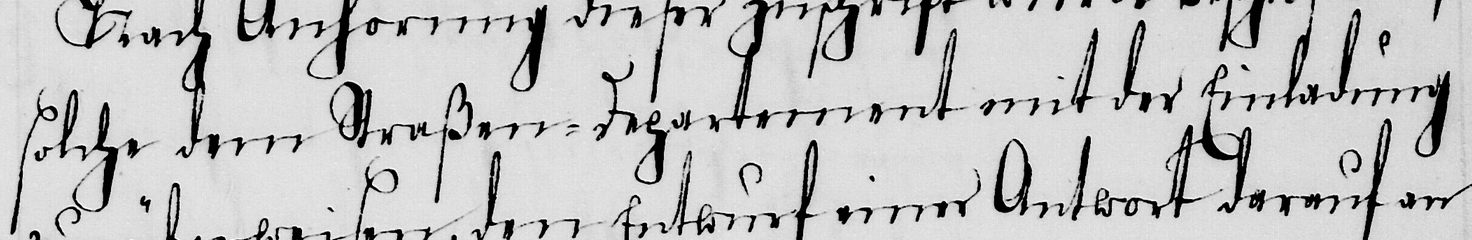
solche dem Straßen-Departement mit der Einladung
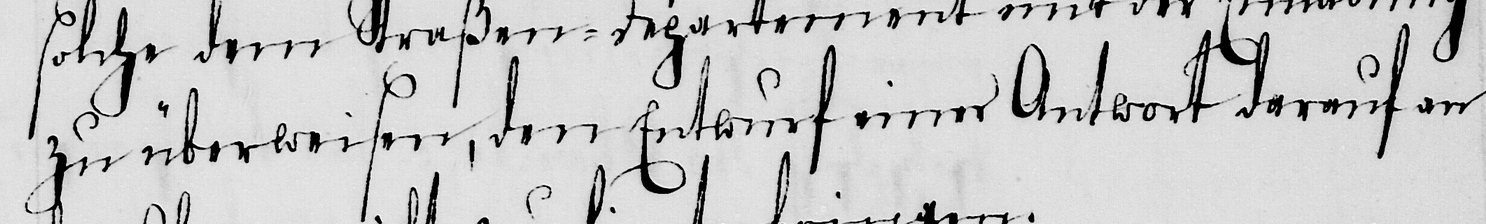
zu überweisen, den Entwurf einer Antwort darauf an
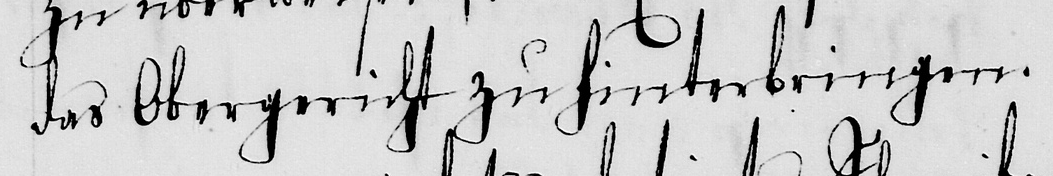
das Obergericht zu hinterbringen.
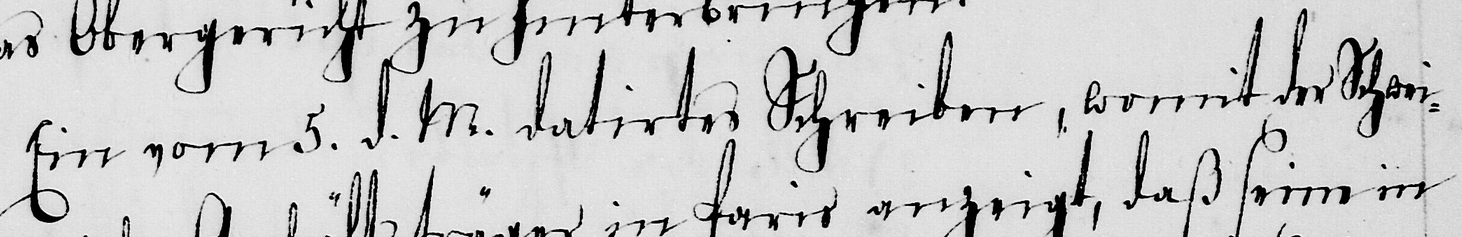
Ein vom 5. d. M. datirtes Schreiben, womit der Schwei¬
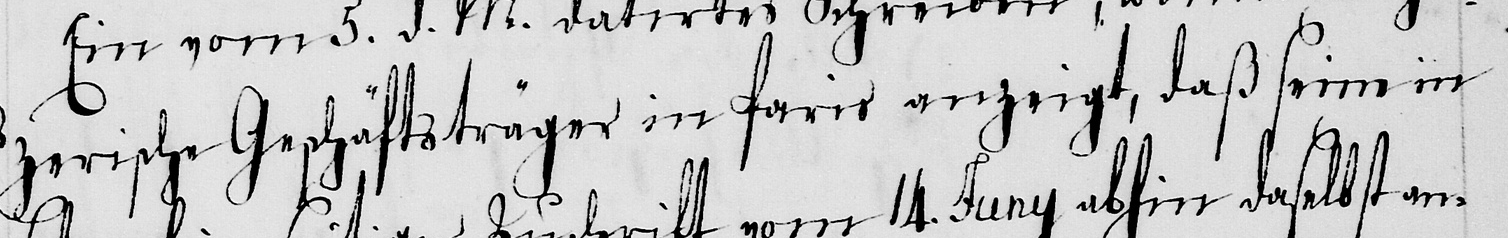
zerische Geschäftsträger in Paris anzeigt, daß seine in
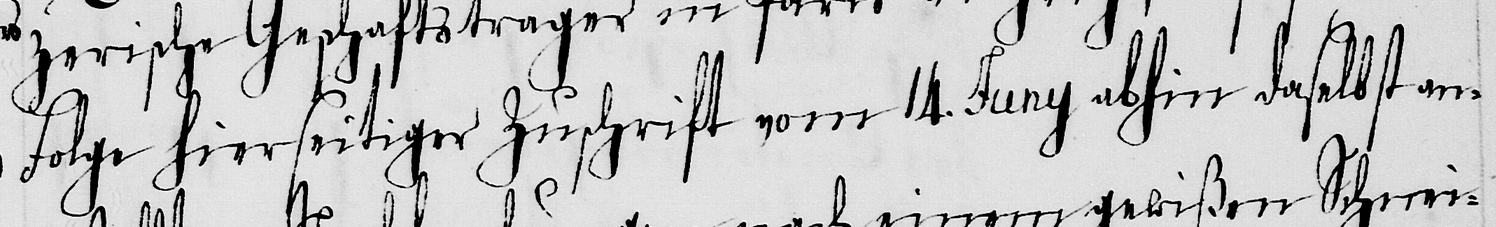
Folge hierseitiger Zuschrift vom 14. Juny abhin daselbst an¬
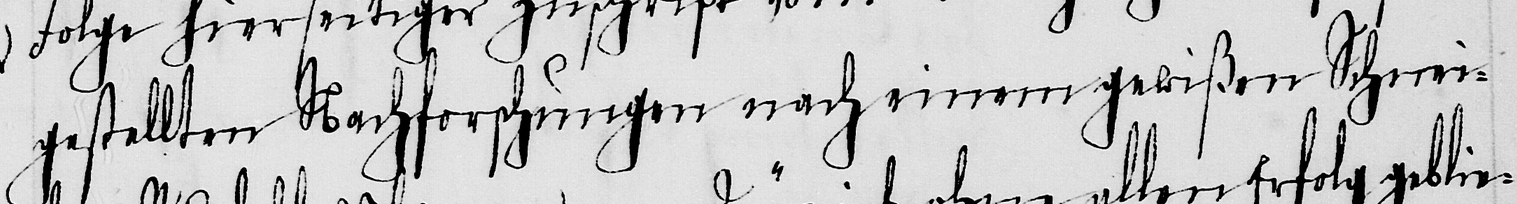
gestellten Nachforschungen nach einem gewißen Schnei¬
